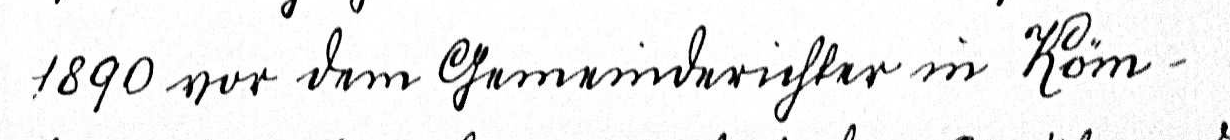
1890 vor dem Gemeinderichter in Kőm¬
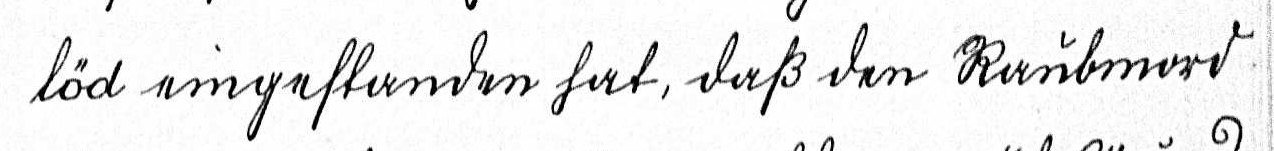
lőd eingestanden hat, daß den Raubmord
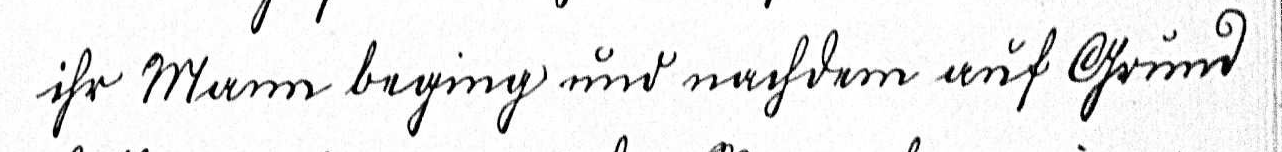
ihr Mann beging und nachdem auf Grund
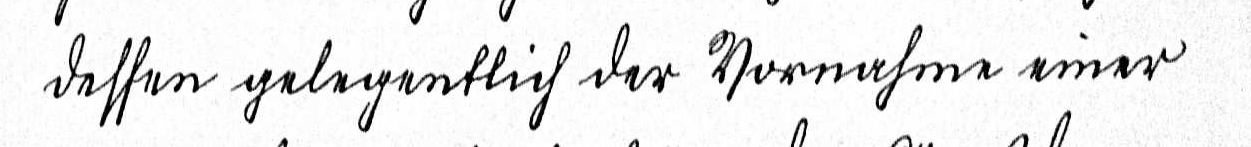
dessen gelegentlich der Vornahme einer
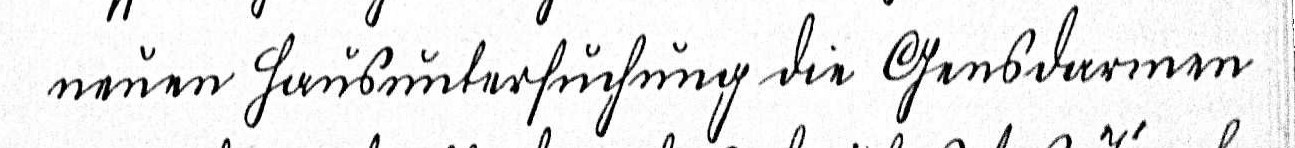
neuen Hausuntersuchung die Gensdarmen
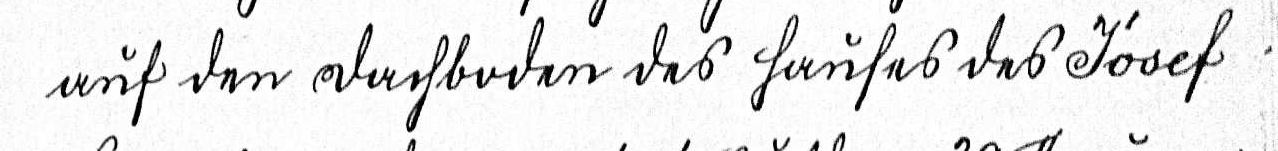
auf den Dachboden des Hauses des Jósef
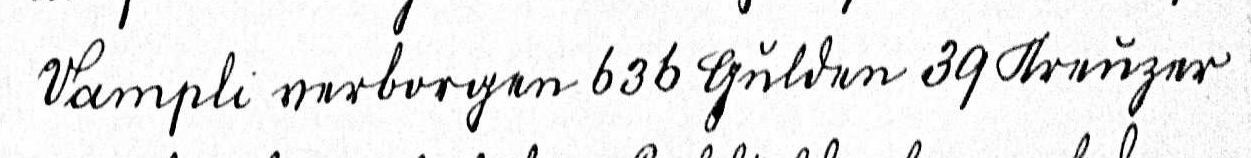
Vampli verborgen 636 Gulden 39 Kreuzer
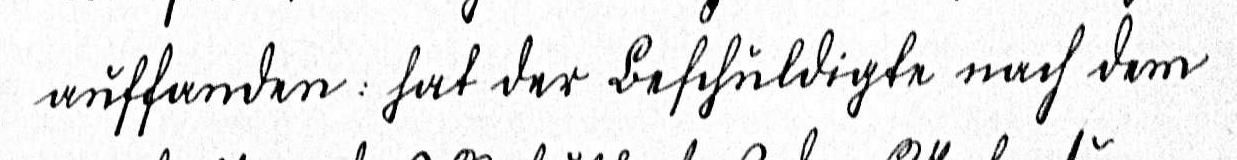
auffanden: hat der Beschuldigte nach dem
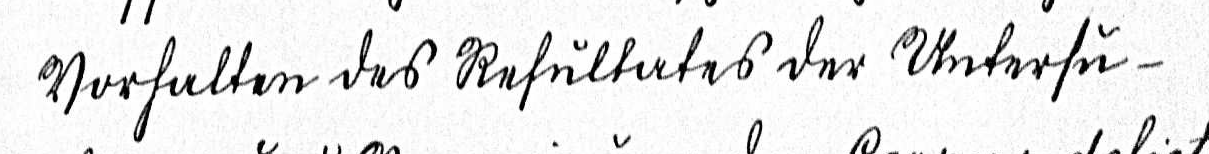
Vorhalten des Resultates der Untersu¬
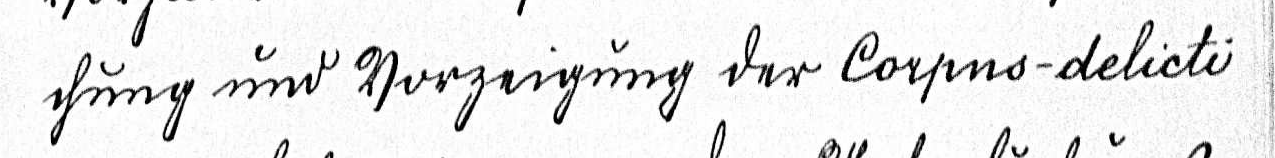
chung und Vorzeigung der Corpus-delicti
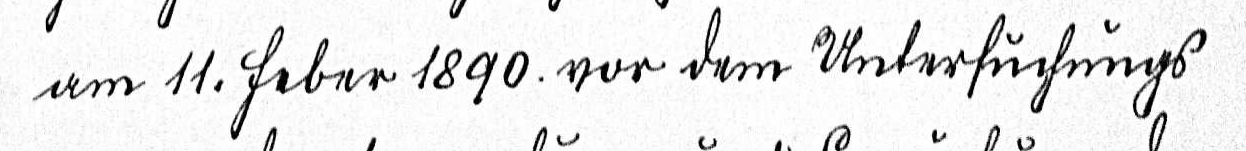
am 11. Feber 1890 vor dem Untersuchungs¬
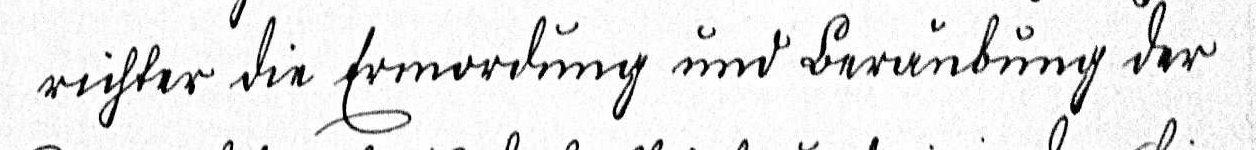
richter die Ermordung und Beraubung der
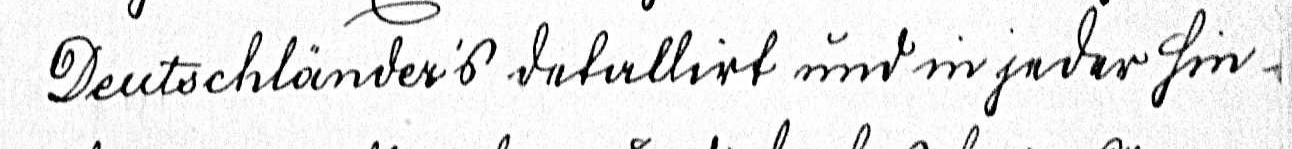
Deutschländer’s datallirt und in jeder Hin¬
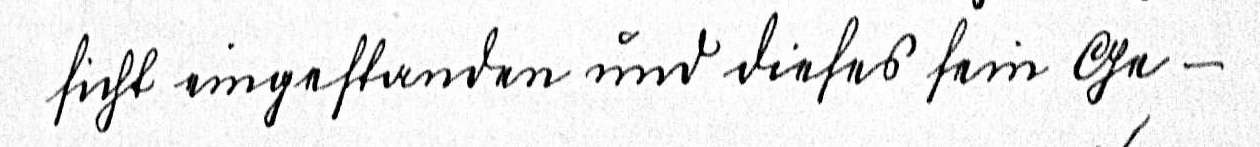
sicht eingestanden und dieses sein Ge¬
